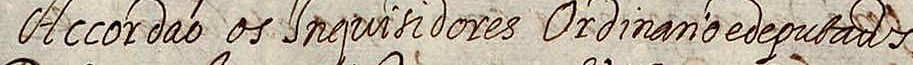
Accordão os Inquisidores Ordinario e deputados
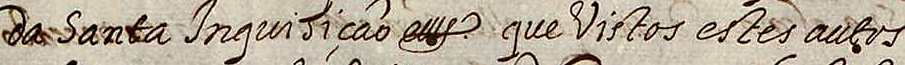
da Santa Inquisição etc que Vistos estes autos
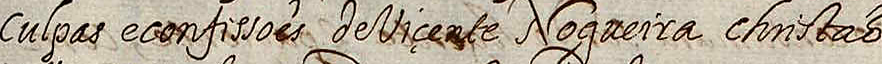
culpas e confissões de Vicente Nogueira christão
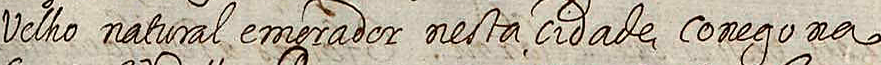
velho natural e morador nesta cidade conego na
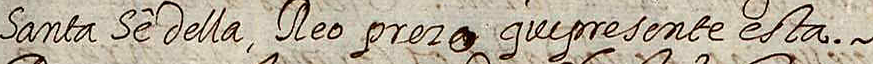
Santa Sê della, Reo prezo que presente esta.
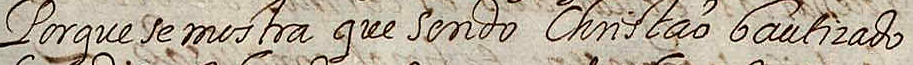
Porque se mostra que sendo Christão bautizado
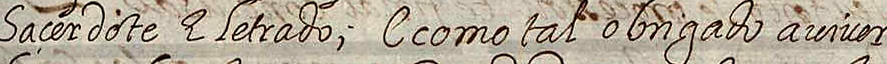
Sacerdote e Letrado; E como tal obrigado a viver
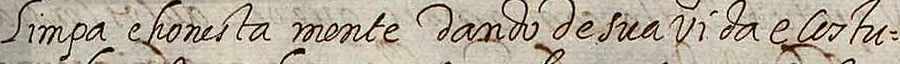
Limpa e honestamente dando de sua vida e costu
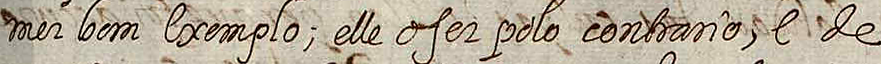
mez bom exemplo; elle o fez pelo contrario; E de
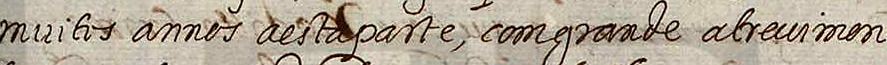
muitos annos a esta parte, com grande atrevimen
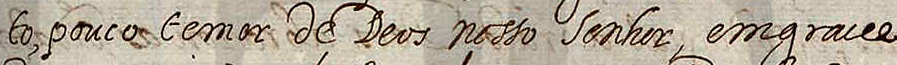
to, pouco temor de Deos Nosso Senhor, em grave
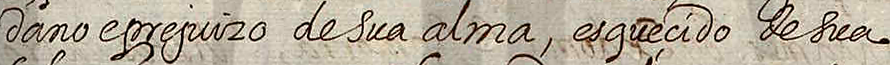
dano e prejuizo de sua alma, esquecido de sua
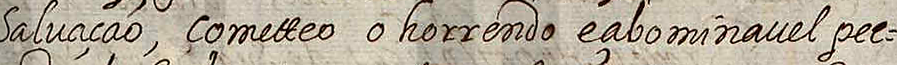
Salvação, cometteo o horrendo e abominavel pec-
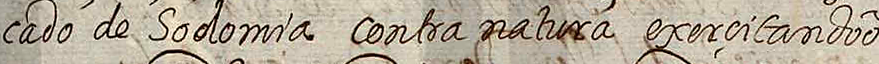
cado de Sodomia contra naturā exercitandoõ
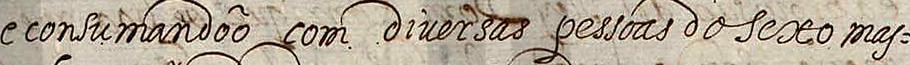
e consumandoõ com diversas pessoas do sexo mas
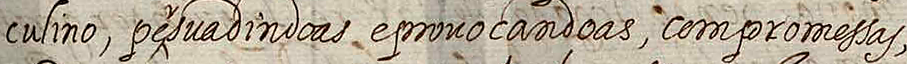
culino, persuadindoas e provocandoas,
